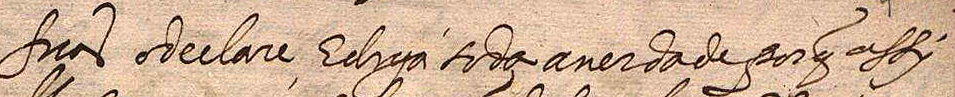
suas o declare, E diga toda a uerdade porq̄ assy
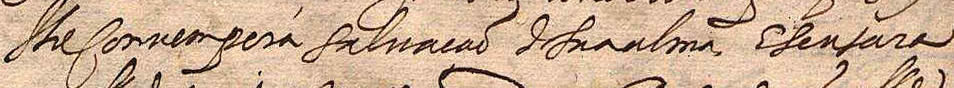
lhe Conuem pera saluaçaõ de sua alma E se usara
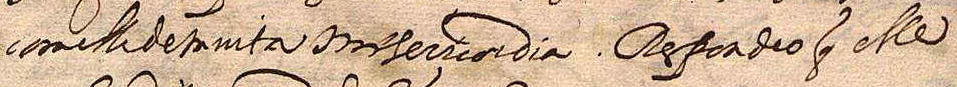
com elle de muita misericordia. Respondeo q̄ elle
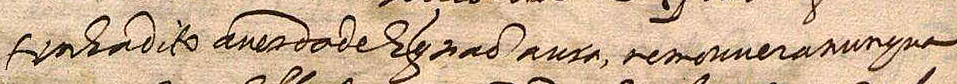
tinha dito a uerdade E q̄ naõ auia, nem ouuera nunqua
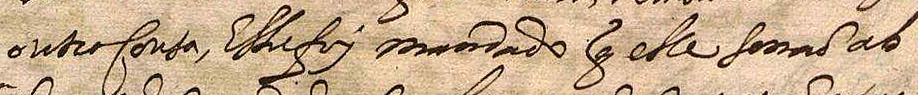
outra Cousa, E lhe foy mandado q̄ elle se naõ ab
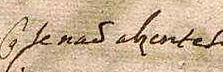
q̄ se naõ abzente sem
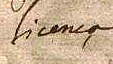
Licença
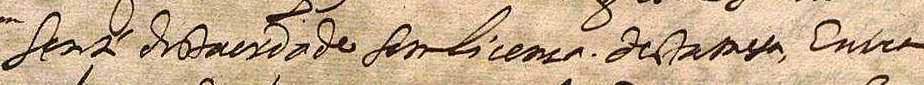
sente desta cidade sem licença desta mesa, E uira
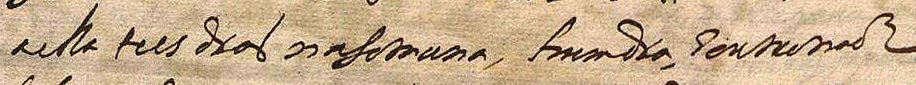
a ella tres dias na somana, hum dia, E outro naõ
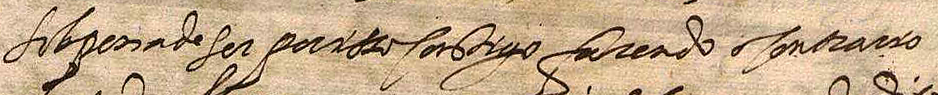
sob pena de ser por isso Castigo fazendo o Contrario
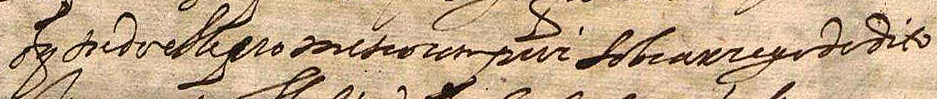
o q̄ tudo elle prometeo comprir sob carrego do dito
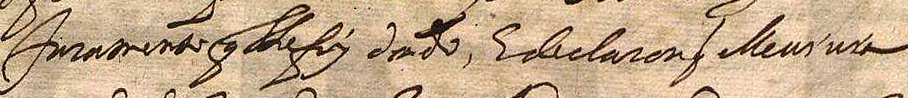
Juramento q̄ lhe foy dado, E declarou elle uiuia
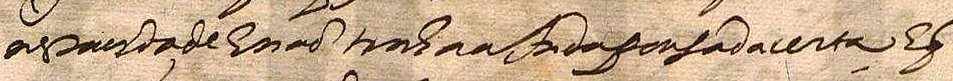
nesta cidade E naõ tinha aInda pousada certa E q̄
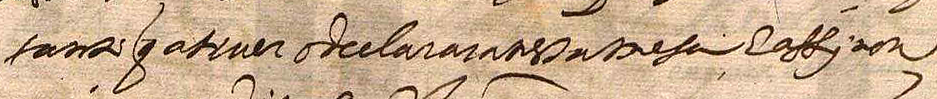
tanto q̄ a tiuer o declarara nesta mesa, E assynou
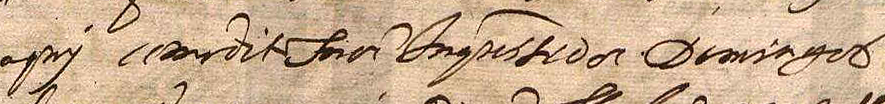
aquy com o dito Snor̄ Inquisidor. Domingos
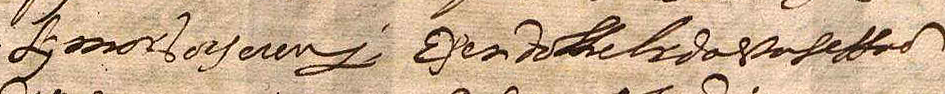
symõis o escreuj. E sendolhe lida esta sessaõ
